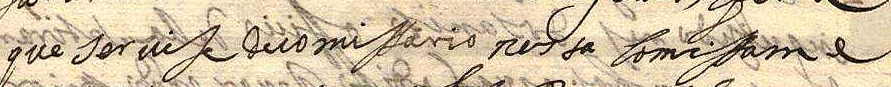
que seruise de comissario nesta comissam e
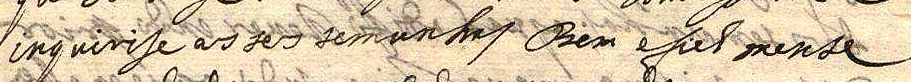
inquirise as testemunhas Bem e fielmente
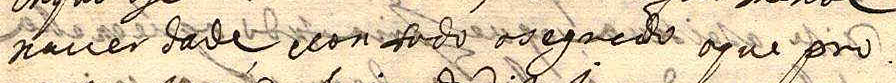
na uerdade e con todo o segredo o que pro
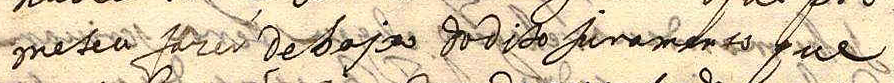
meteu fazer debajxo do dito juramento que
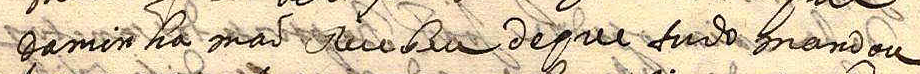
da minha maõ Recebeu de que tudo mandou
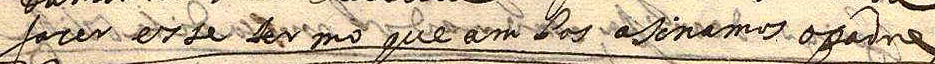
fazer este termo que ambos asinamos o padre
